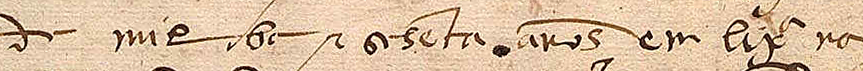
de mil bc e sesēta ānos em lixa na
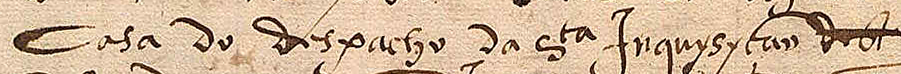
Casa do despacho da Sta Jnquysyção _
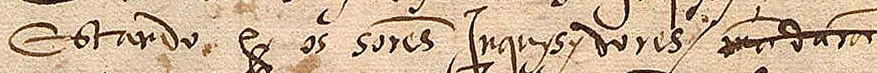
Estando hy os s̄ores Jnquysydores / mādarā
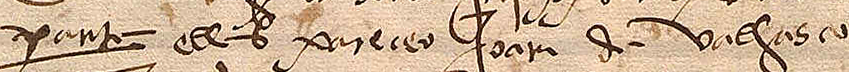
ꝑante elles pareceo Joam de Valhasco
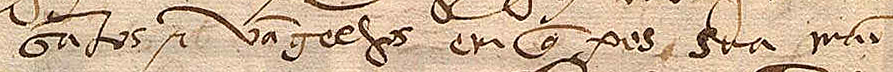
sātos evāgelhos em q̄ pos sua mão
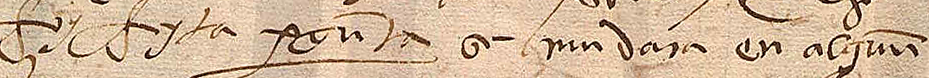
foy feyta ꝑgūta se mudara en algūu
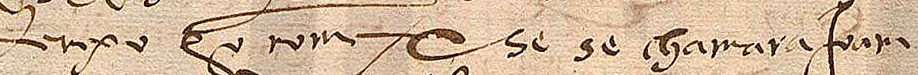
tempo ho nome / e se se chamara Joam
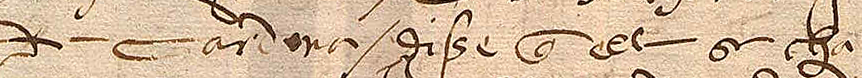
de cardona / disse q̄ elle se cha
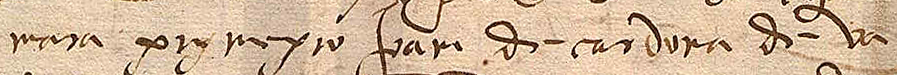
mara prymeyro Joam de cardona de Va
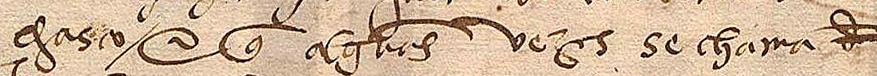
lhasco / e q̄ algūas vezes se chama _
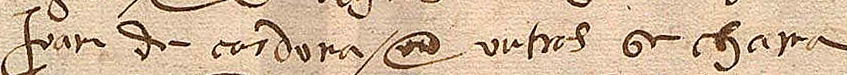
Joam de cardona / ē outras se chama
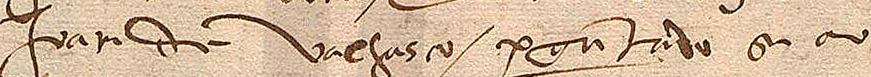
Joam de valhasco / ꝑgūtado se ao
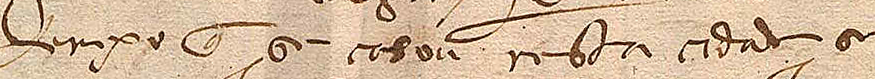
tempo q̄ se casou nesta cidade se
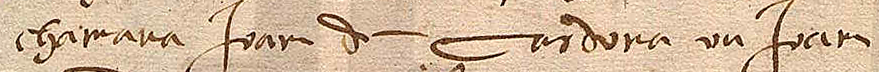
chamaua Joam de Cardona ou Joam
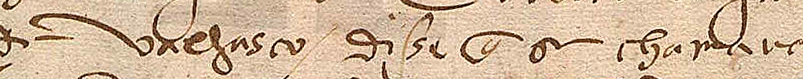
de valhasco / disse q̄ se chamaua
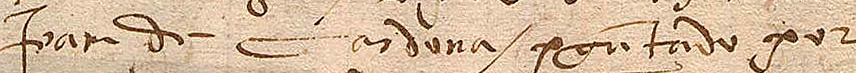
Joam de Cardona / ꝑgūtado por
